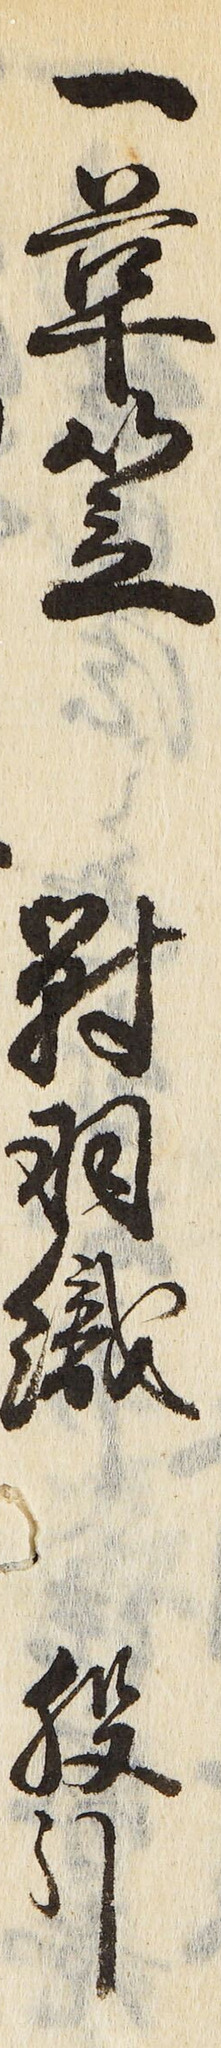一革笠対羽織股引
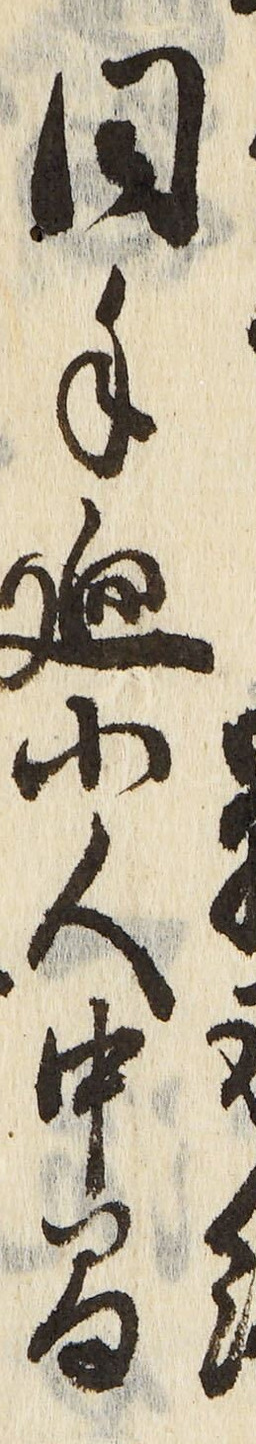同手廻小人中間
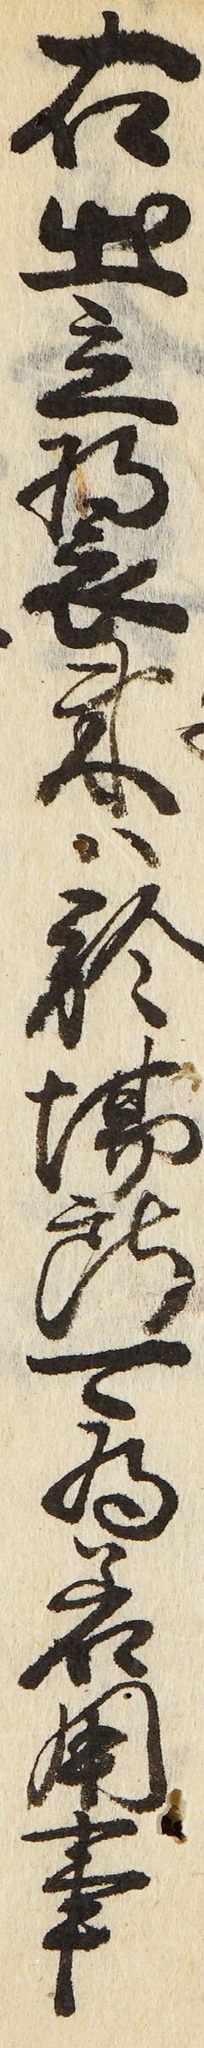右出立装束ハ於場所可為着用事
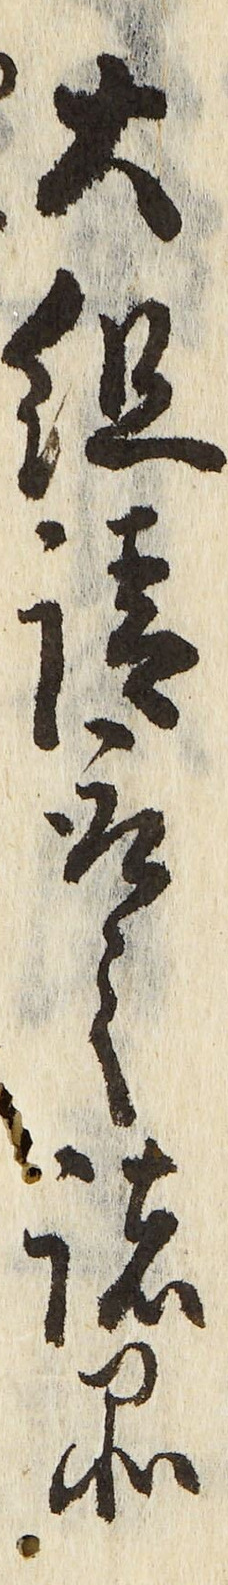大組請取之諸品
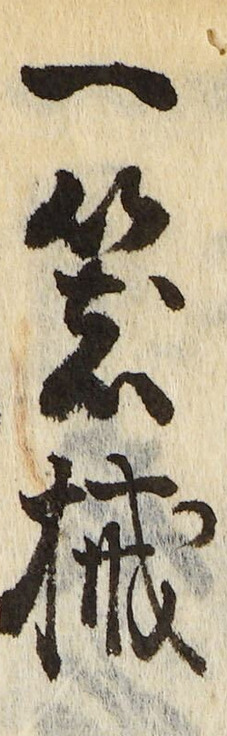一器械
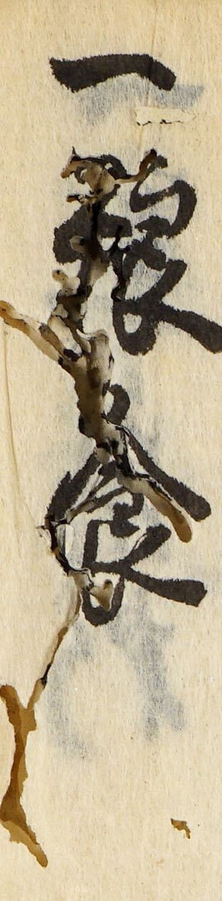一粮食
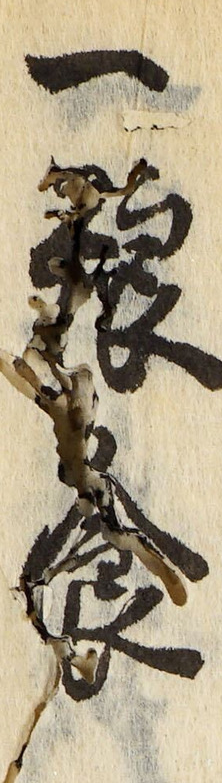一粮食

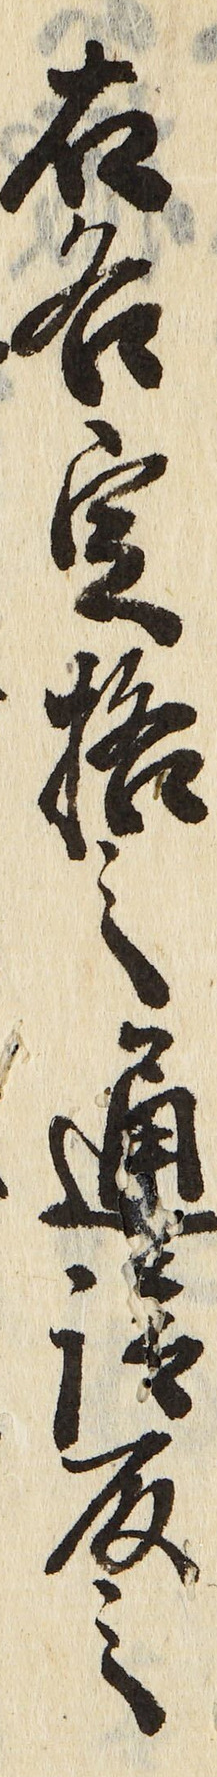右各定格之通請取之
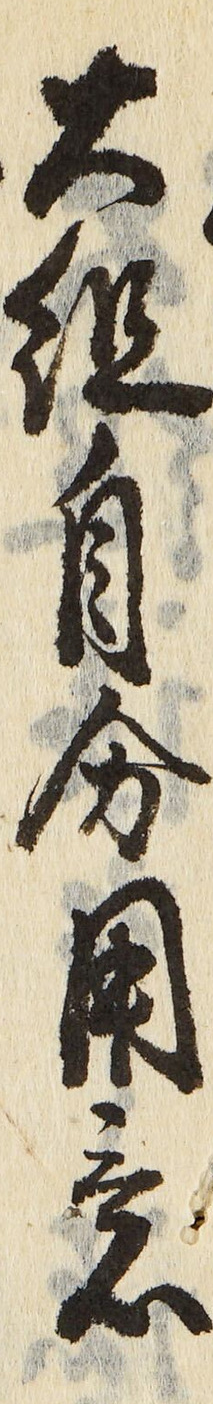大組自分用意
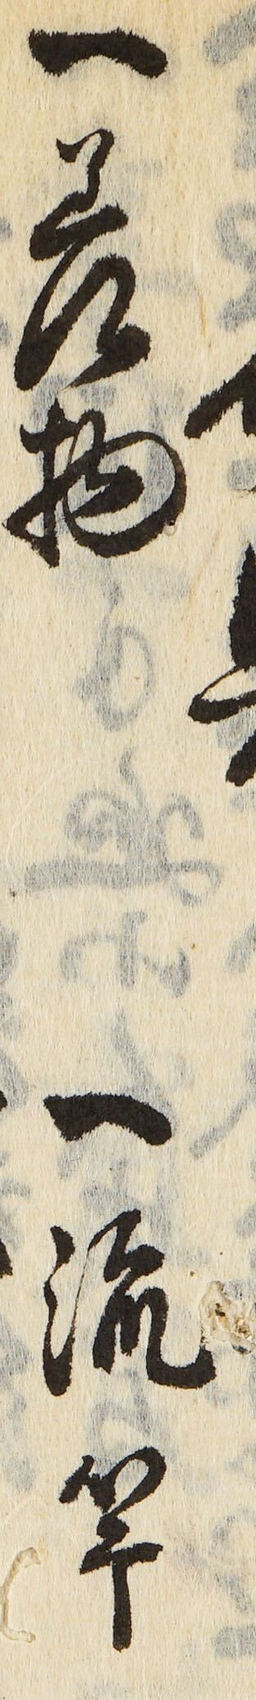一差物一流竿
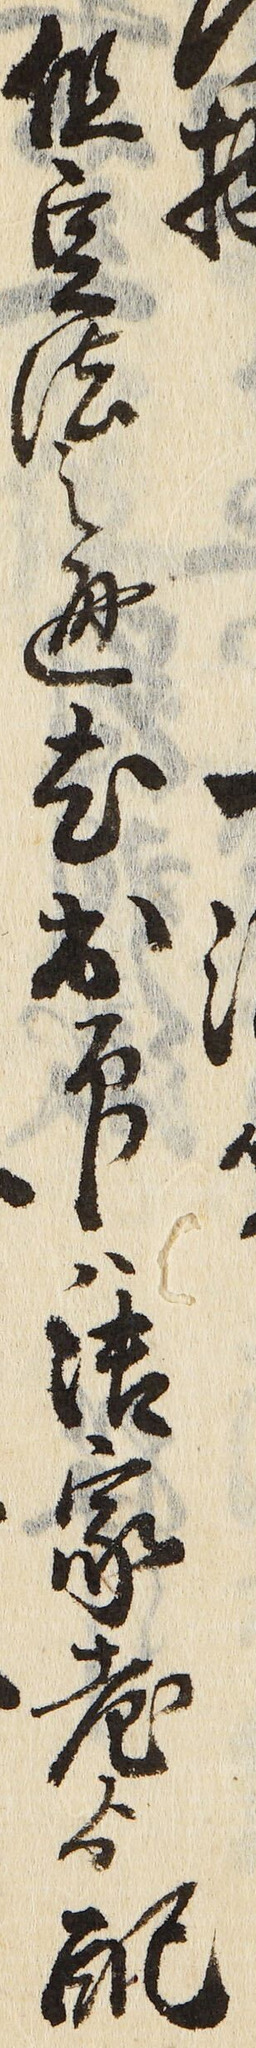但定法之通尤出印ハ御家老ゟ配
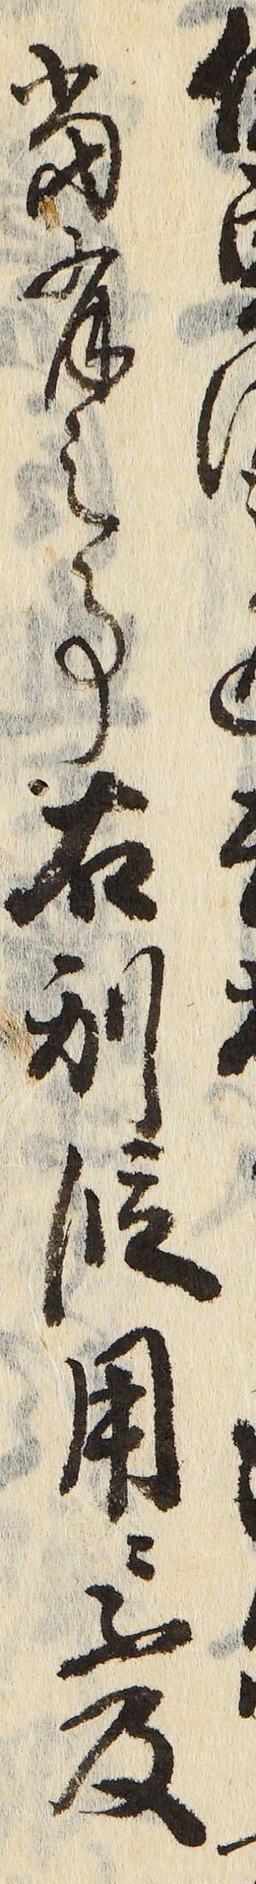当有之事右別段用ニ不及
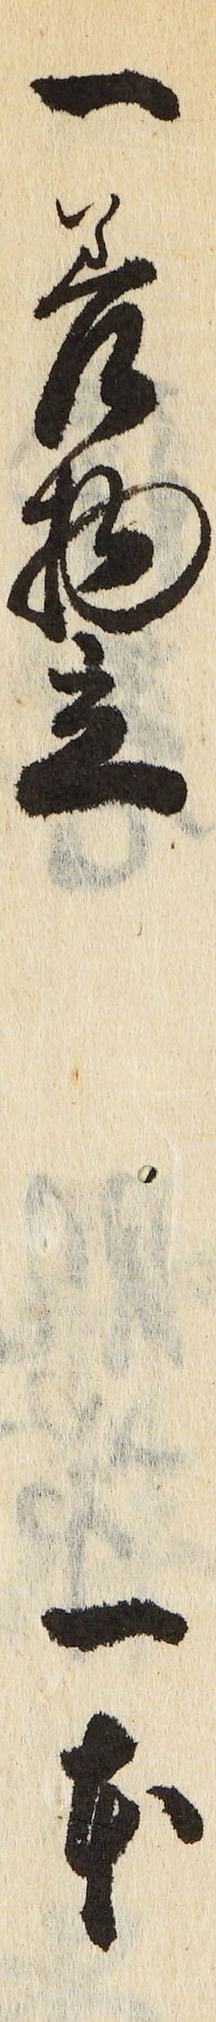一差物立一本
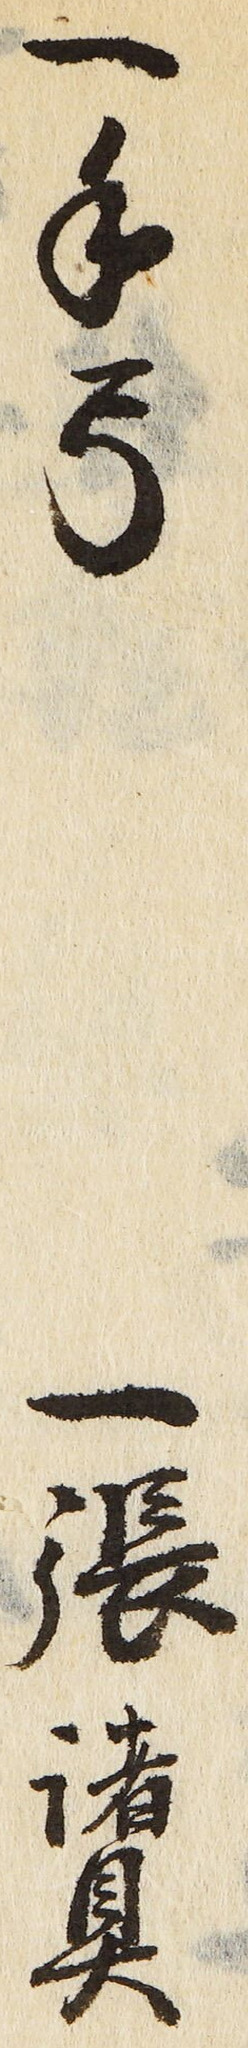一手弓一張諸具
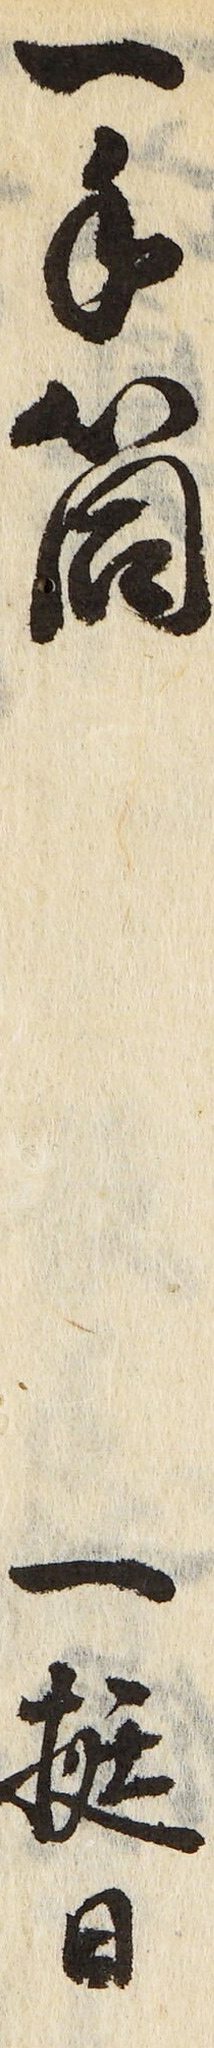一手筒一挺日
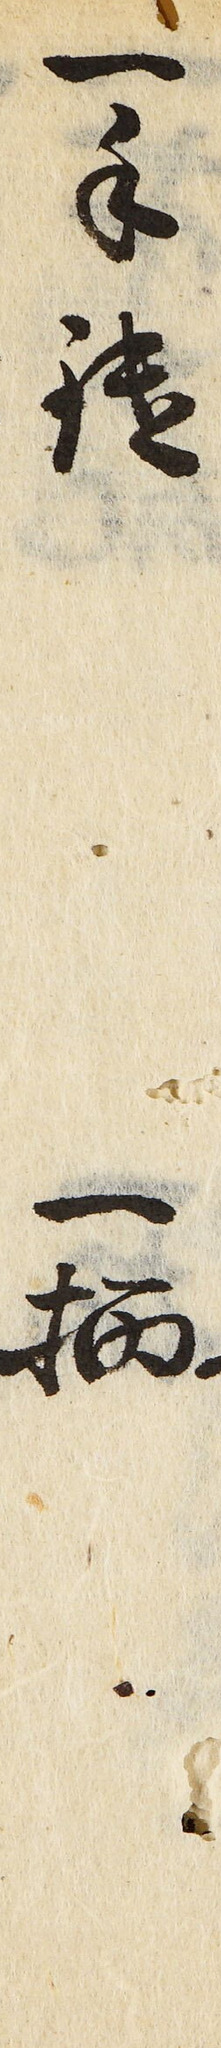一手鑓一柄
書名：御領海江異国船漂流有之節御手当之次第大組頭心得之廉々書集記
